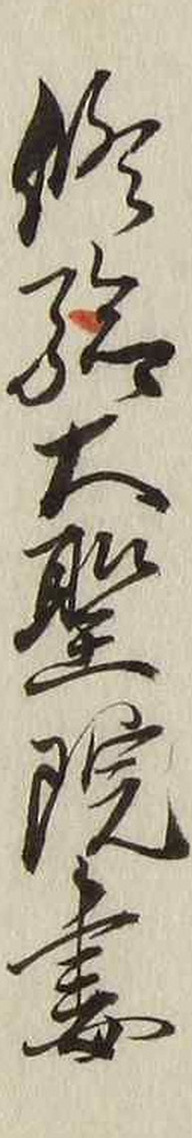女修験大聖院妻
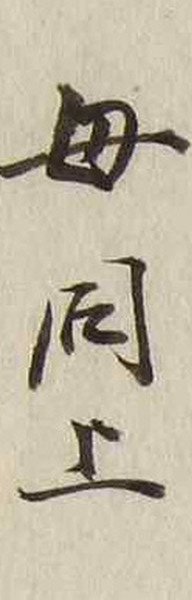母同上

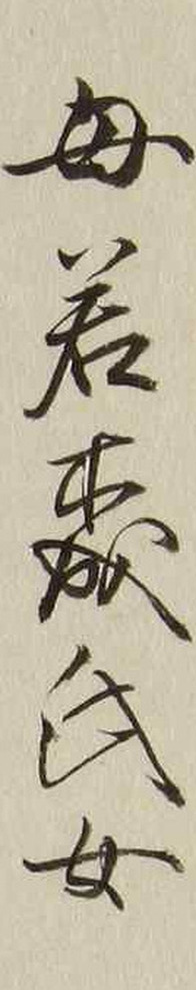母若森氏女
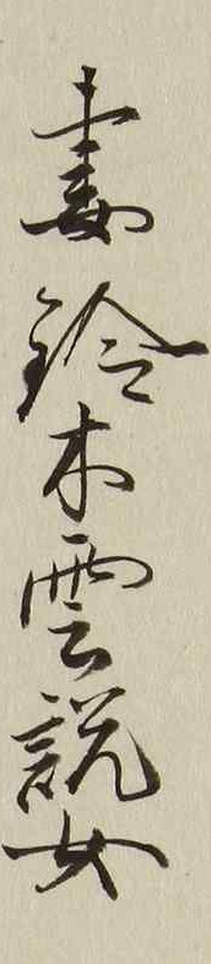妻鈴木雲説女
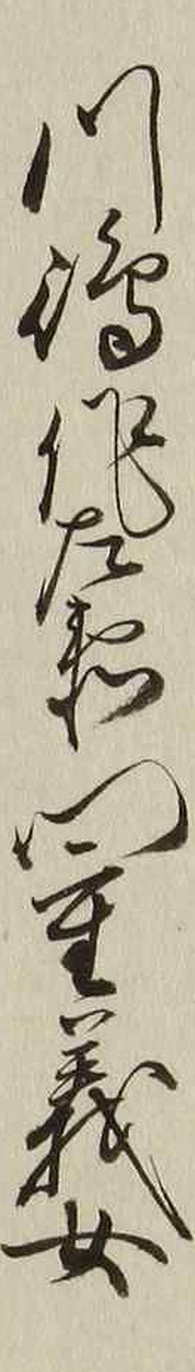川嶋作左衛門重義女
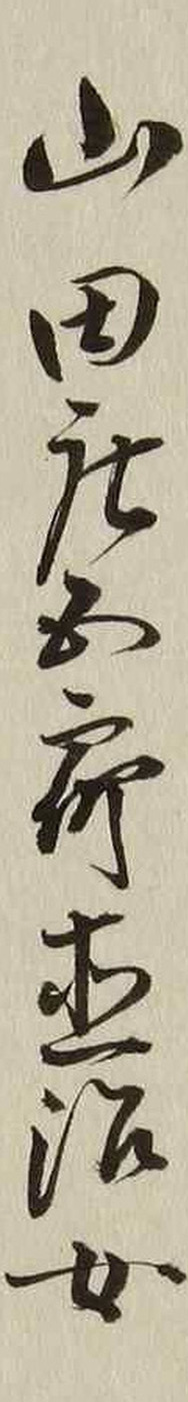山田庄五郎直治女
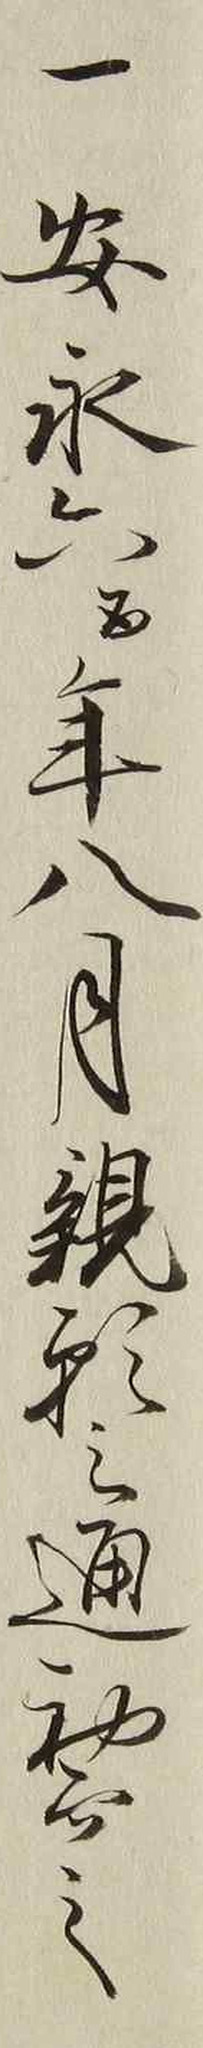一安永六酉年八月親願之通初而之
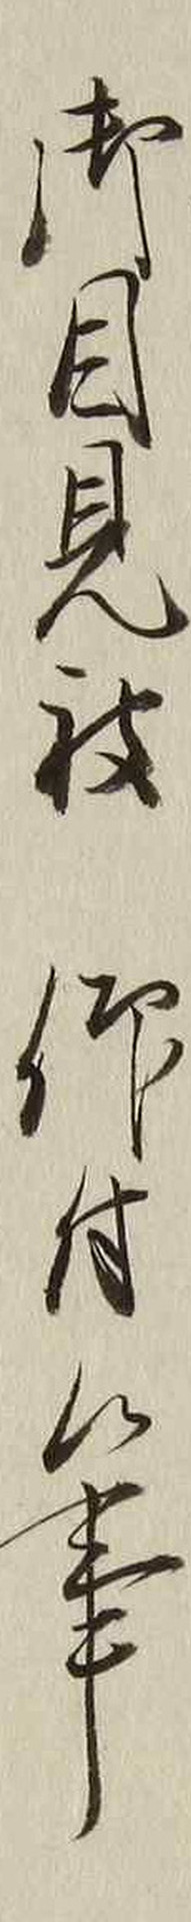御目見被仰付候事
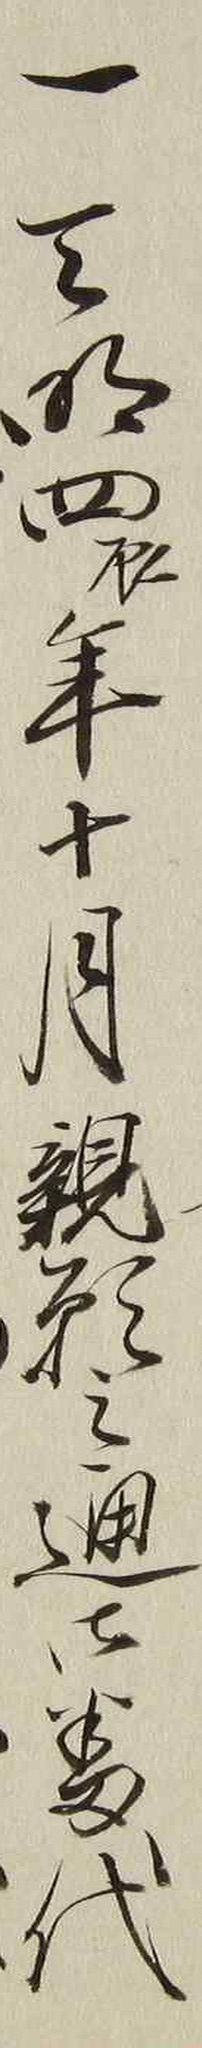一天明四辰年十月親願之通御番代
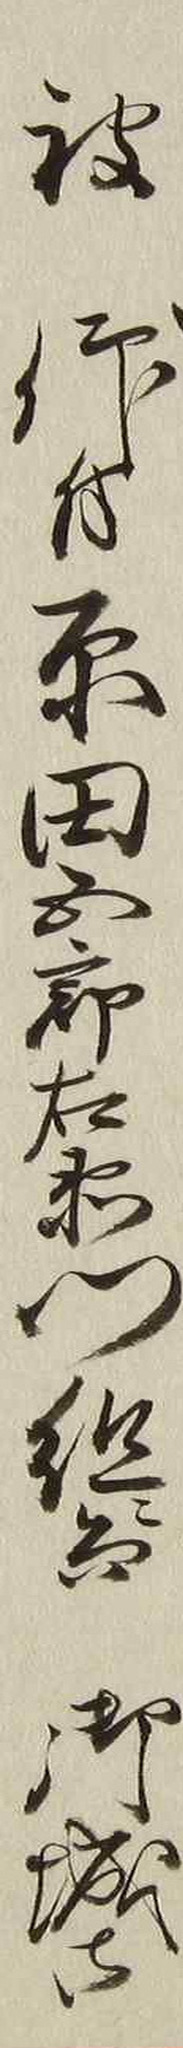被仰付原田五郎右衛門組に而御城御
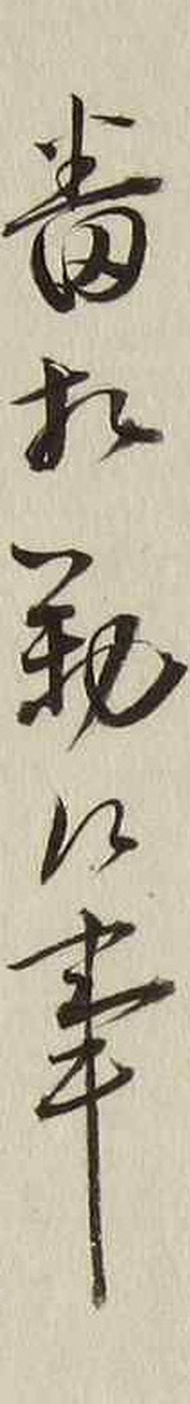番相勤候事
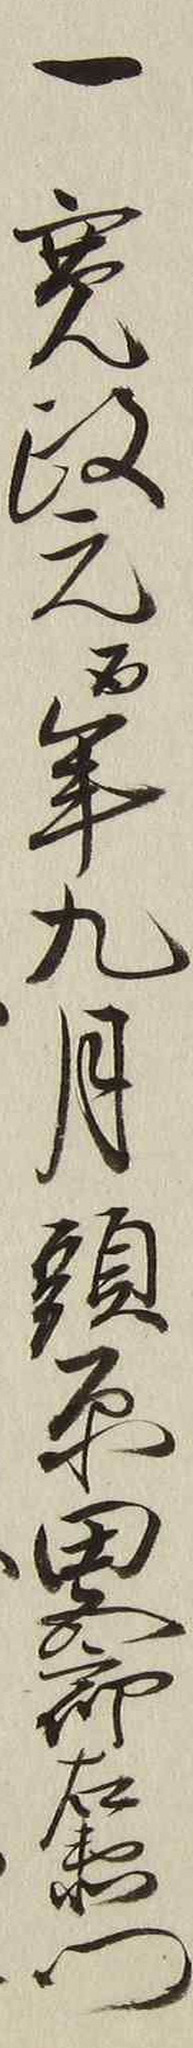一寛政元酉年九月頭原田五郎右衛門
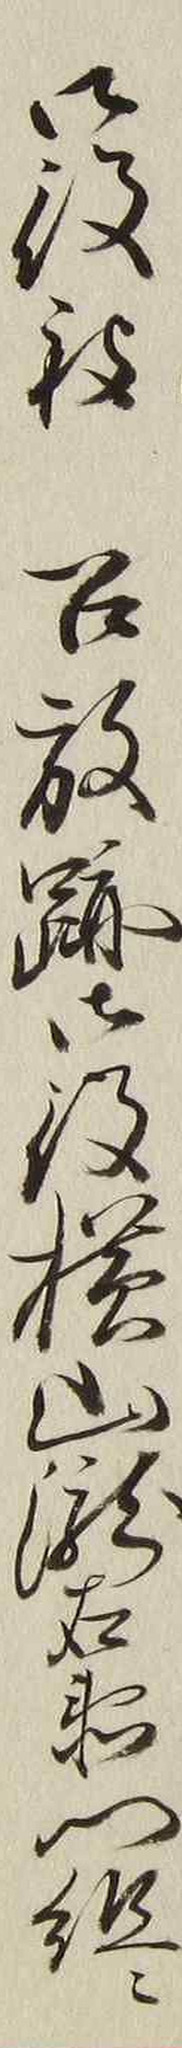御役被召放跡御役横山滝右衛門組に
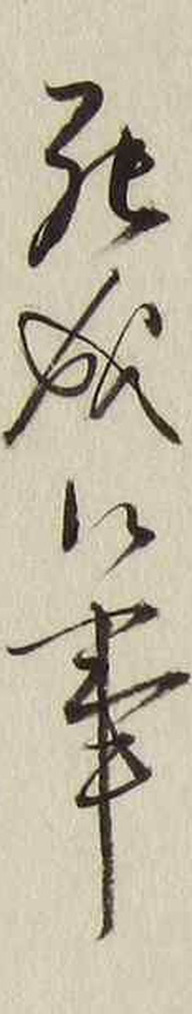罷成候事
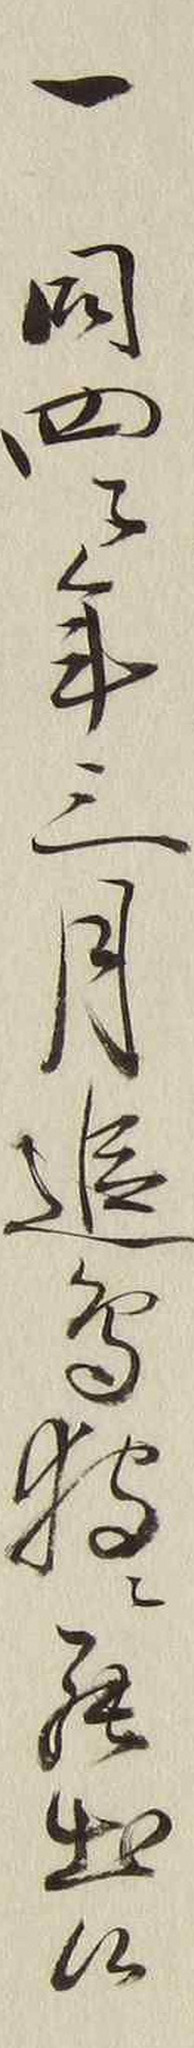一同四子年三月追鳥狩に罷出候
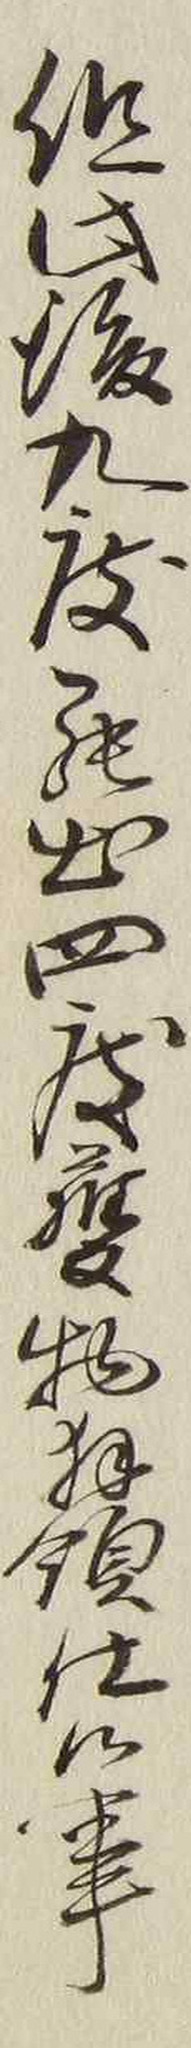但比後九度罷出四度獲物拝領仕候事
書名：諸士系譜　巻之157　ね之部1
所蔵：会津若松市立会津図書館
